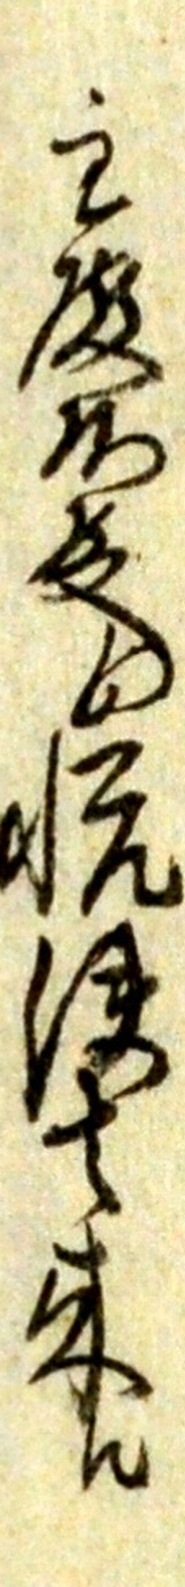主殿頭殿ゟ悦使者来ル
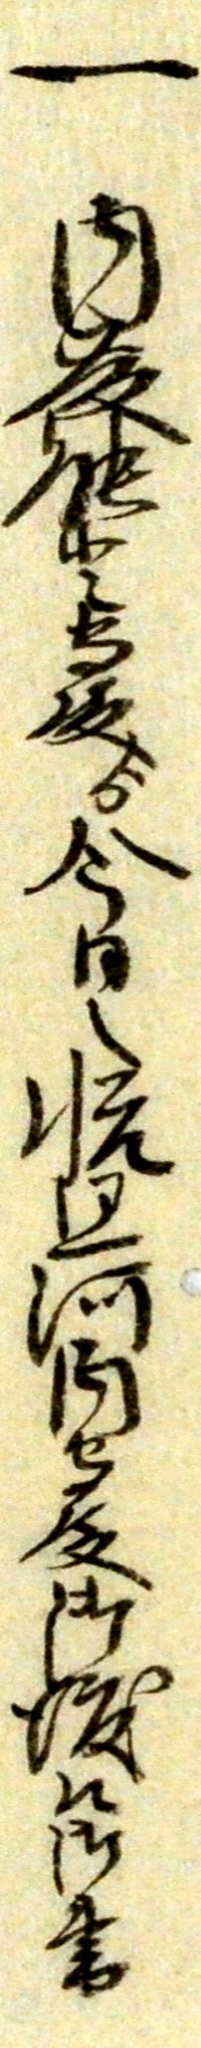一内藤能登守殿ゟ今日之悦且河内守殿御渡候御書
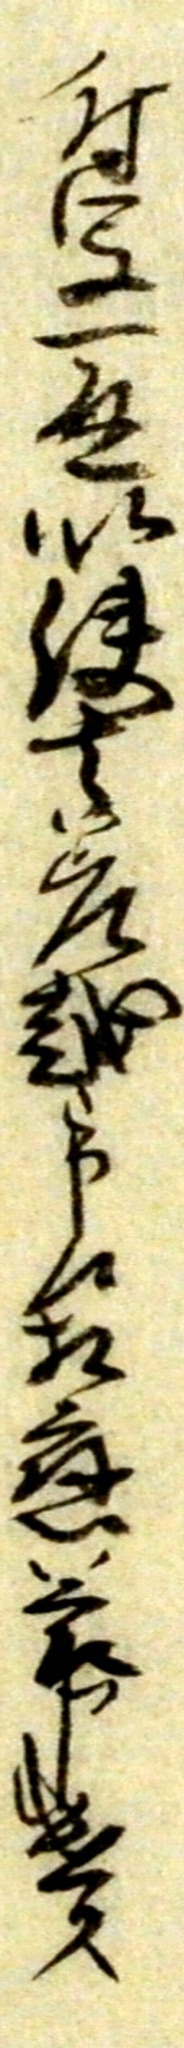付写一通以使者差越被申候相応答申遣ス
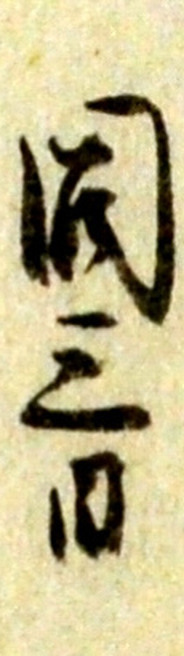同三日
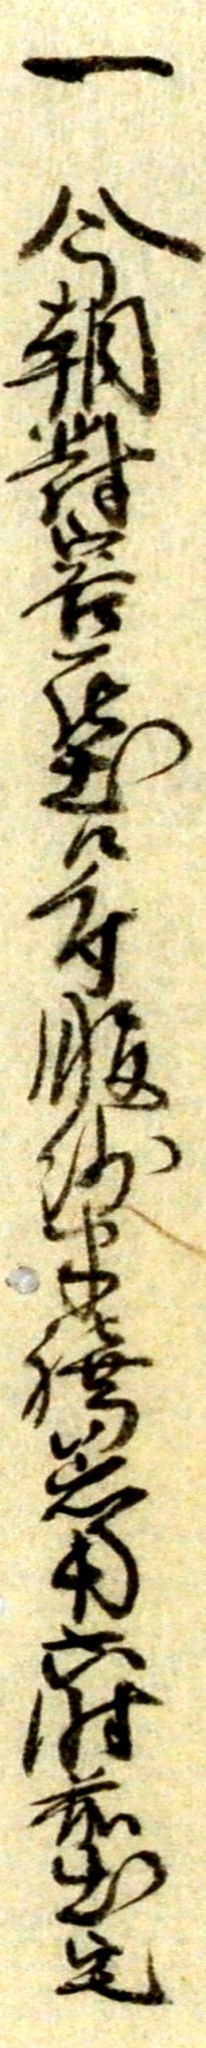一今朝対客罷出候付服紗半袴着用六時前出宅
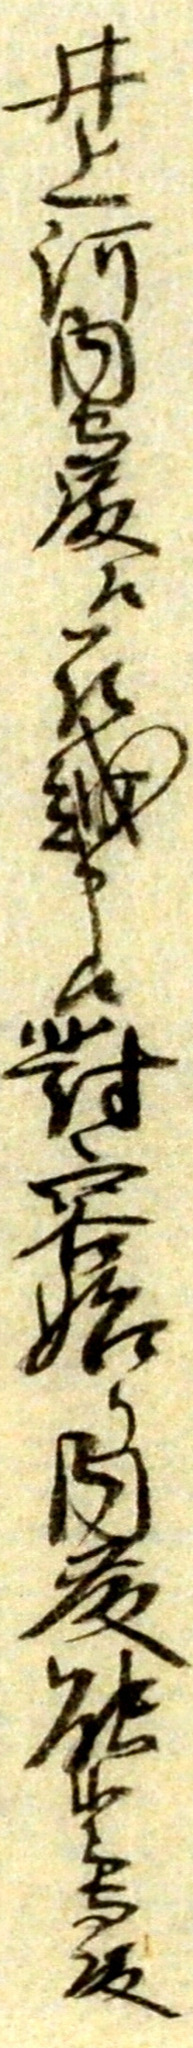井上河内守殿江罷越申候対客始り内藤能登守殿
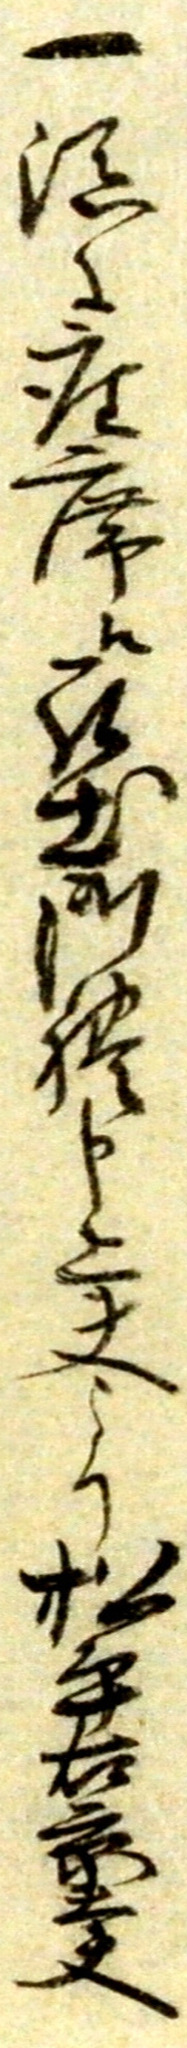一諸に御座席江罷出御礼申上夫より松平右京太夫
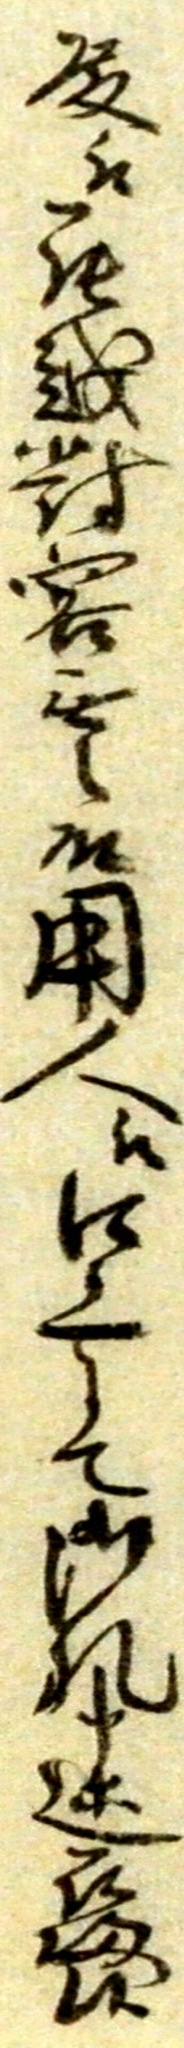殿江罷越対客無之故用人江口上にて御礼申述罷帰候
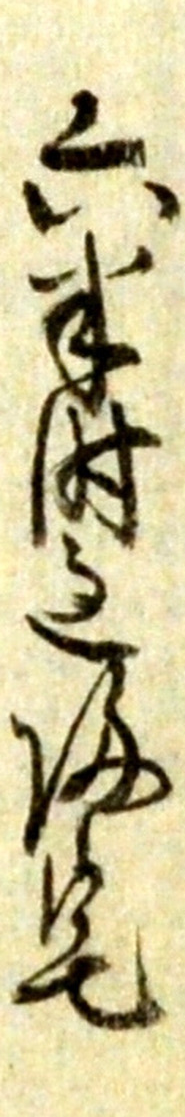六半時過帰宅
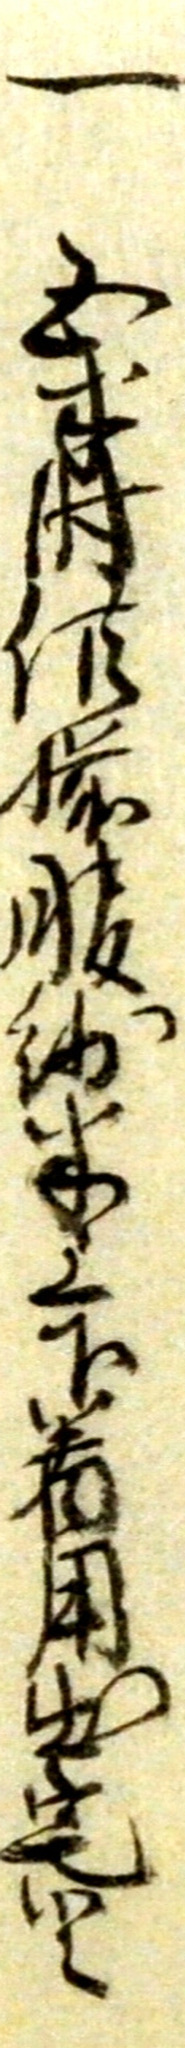一五半時供揃服紗半上下着用出宅登

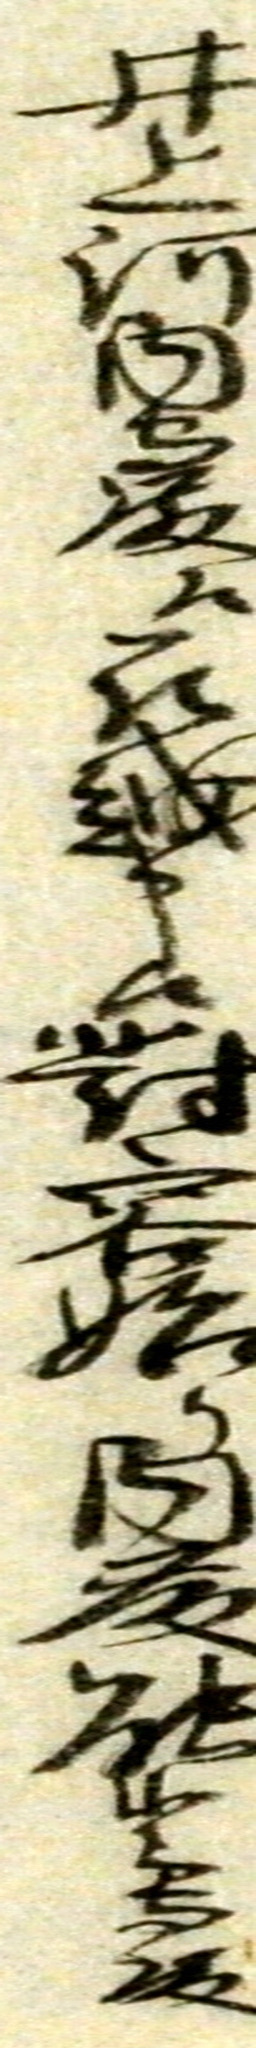井上河内守殿江罷越申候対客始り内藤能登守殿
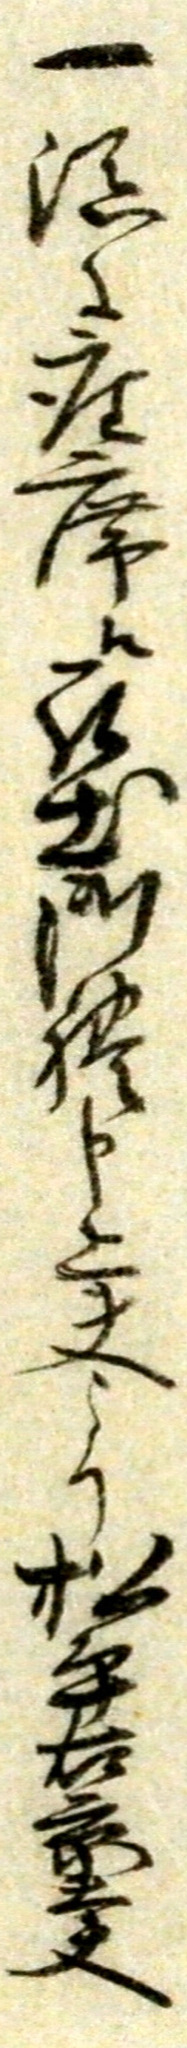一諸に座席江罷出御禮申上夫より松平右京太夫
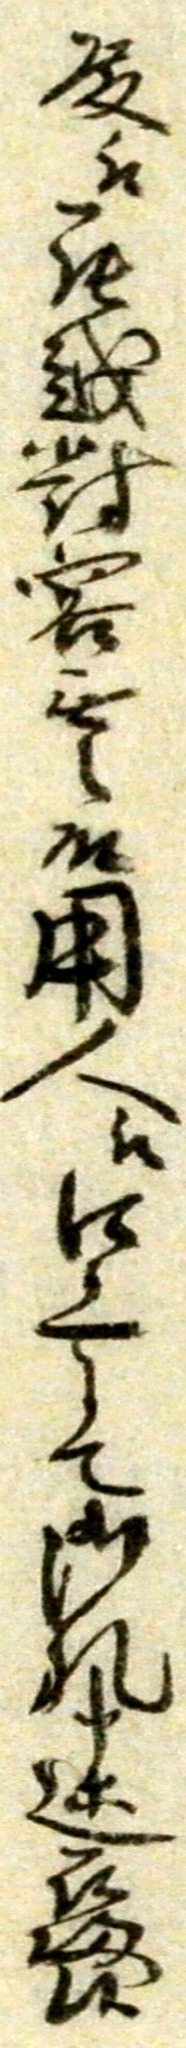殿江罷越対客無之故用人江口上にて御礼申述罷帰候
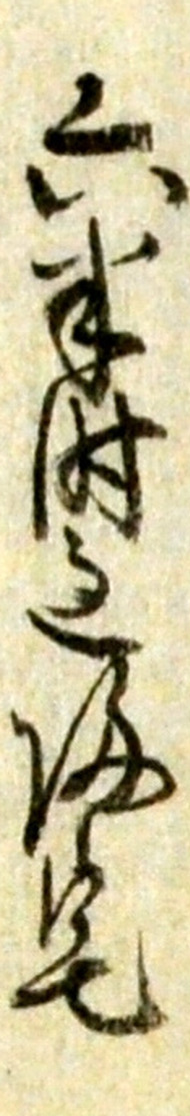六半時過帰宅
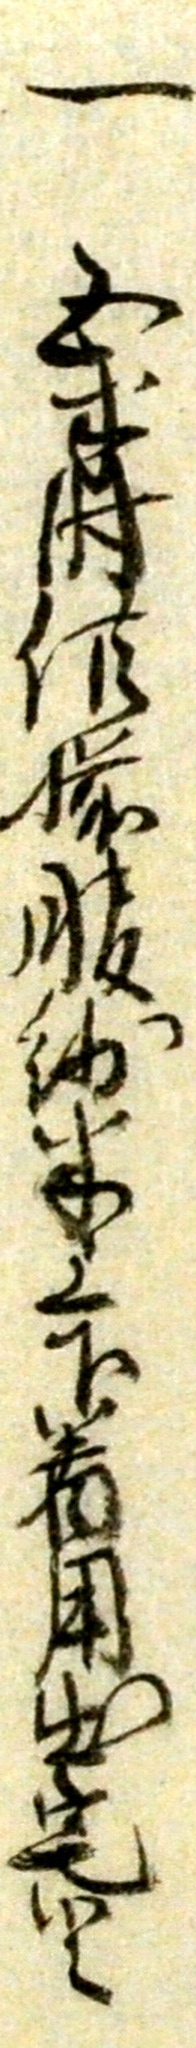一五半時供揃服紗半上下着用出宅登
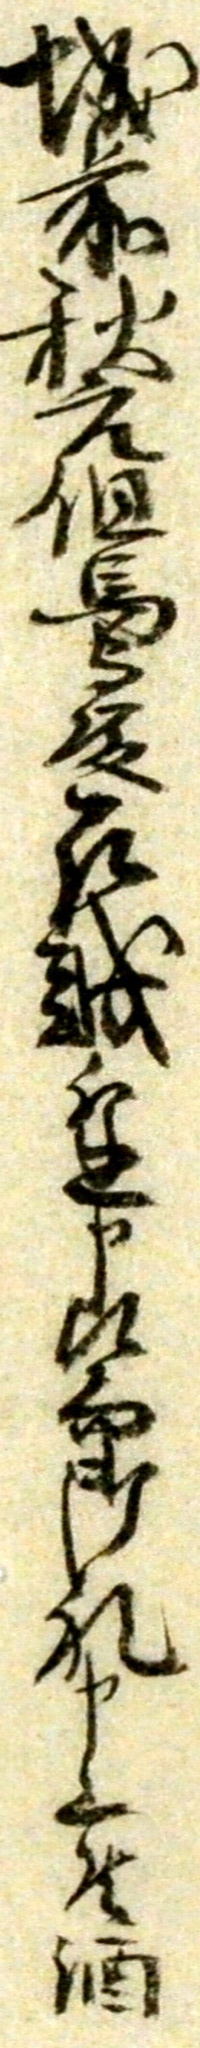城前秋元但馬守殿罷越凡申候而御礼申上候酒
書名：日光御名代相勤候節ノ留
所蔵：伊那市立高遠町図書館・合同会社AMANE
